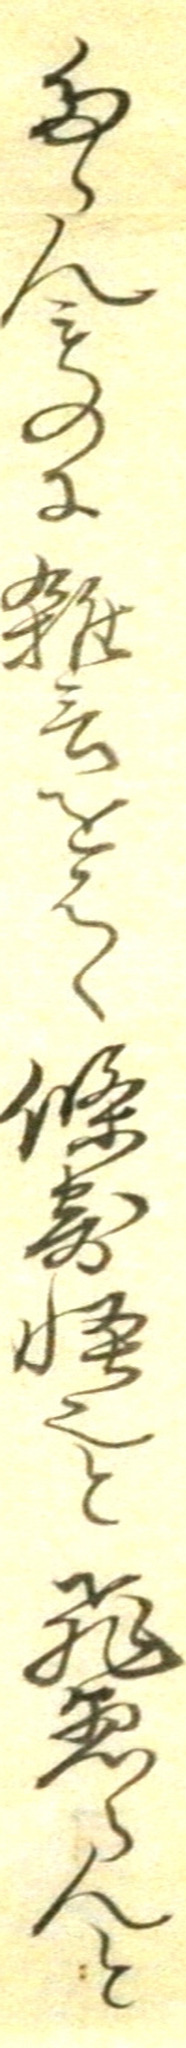たらんものに雑言をはく条奇怪也と飛懸らんと
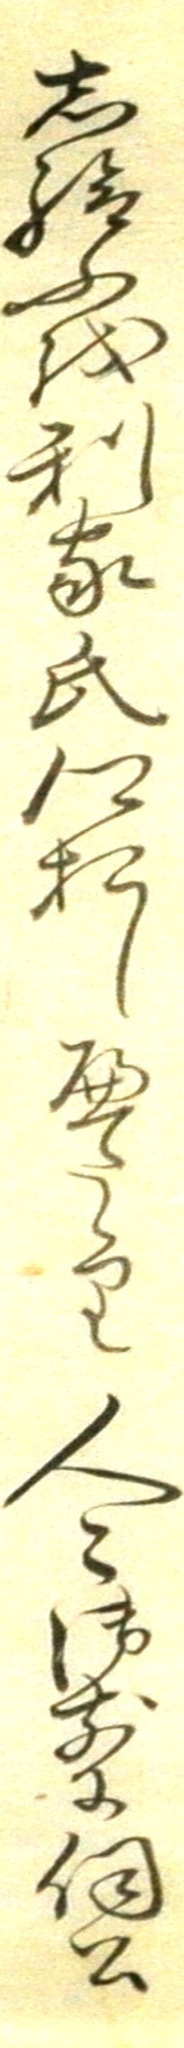し給ふを利家氏郷おしへたゝり人々御前に伺公
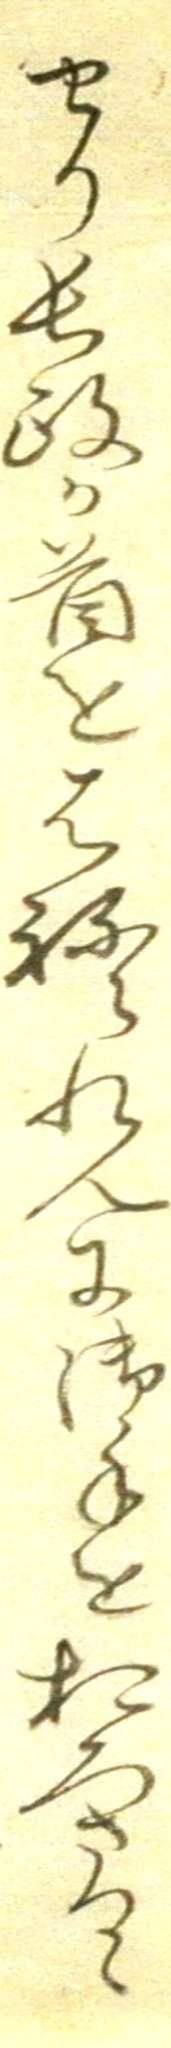せり長政か首をはねられんに御手をおろさるゝ
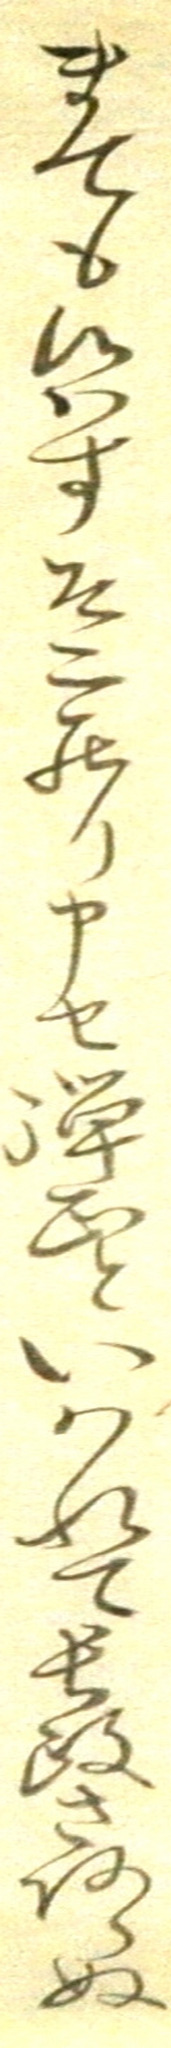まても候はすそこ居り申せ弾正といはれて長政さあらぬ
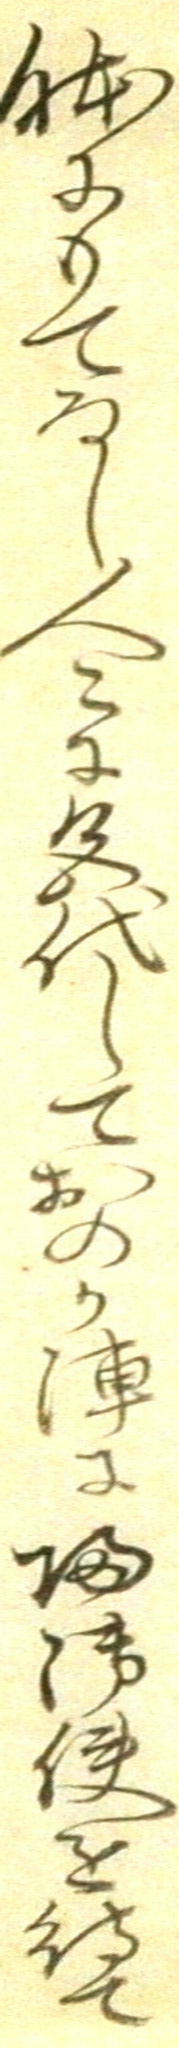体にもてなし人々に色代しておのか陣に帰御使を待て
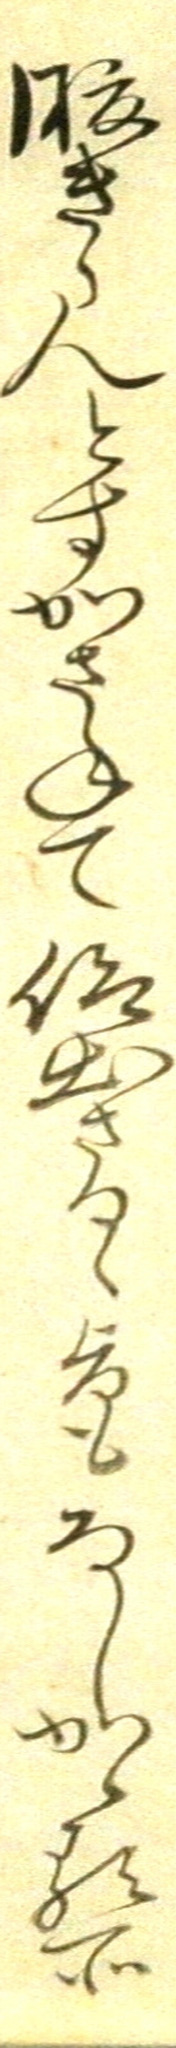腹きらんとすかさねて仰出さるゝ旨もなしかゝる所
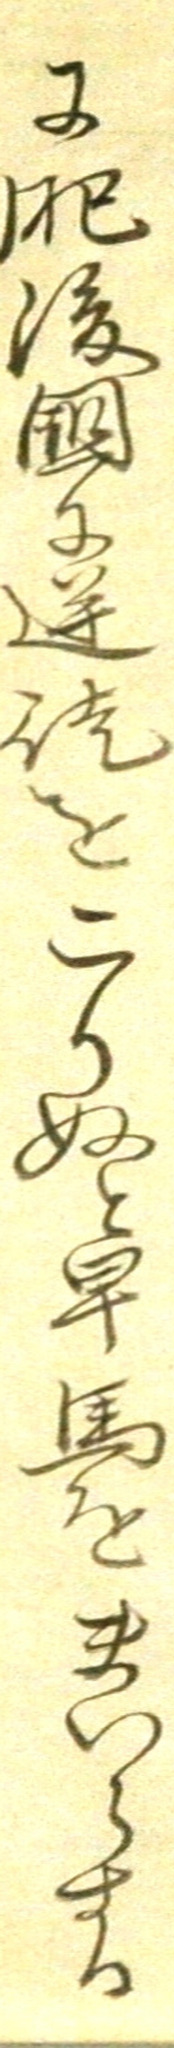に肥後国に逆徒をこりぬと早馬をまいらする
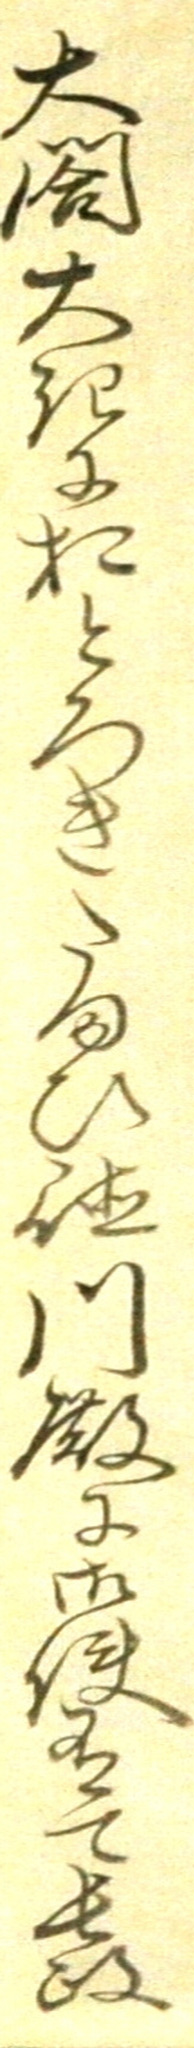太閤大きにおとろきたまひ徳川殿に御使有て長政
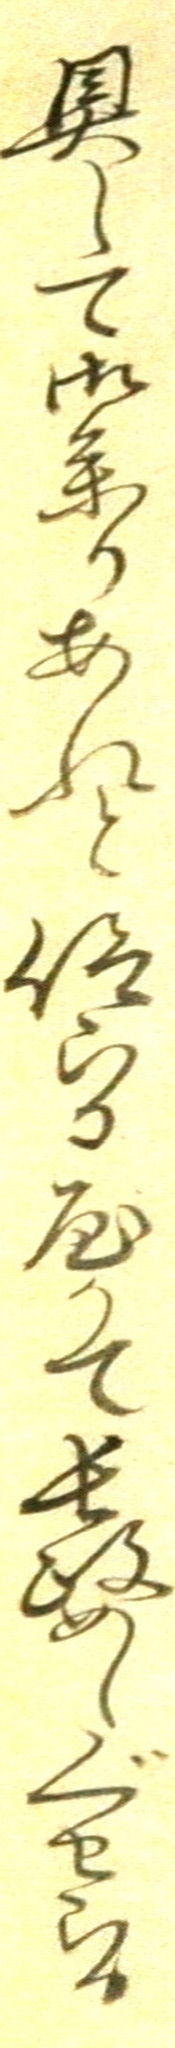具して御参りあれと仰らるやかて長政めしぐせらる

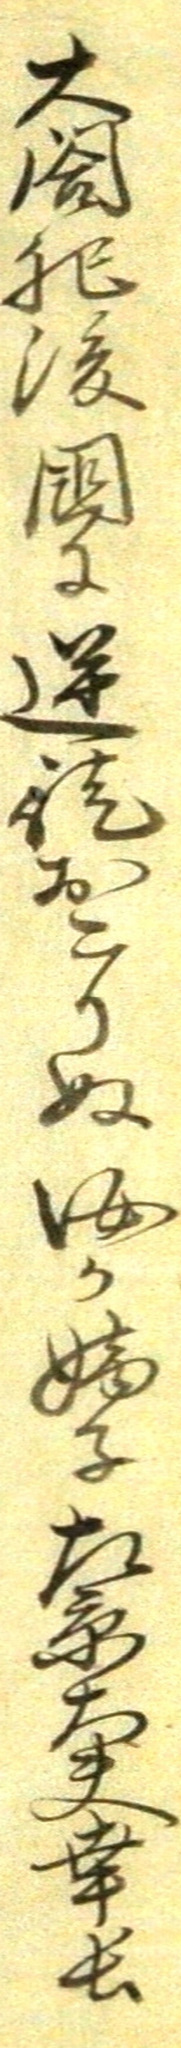太閤肥後国に逆徒おこりぬ汝か嫡子左京大夫幸長
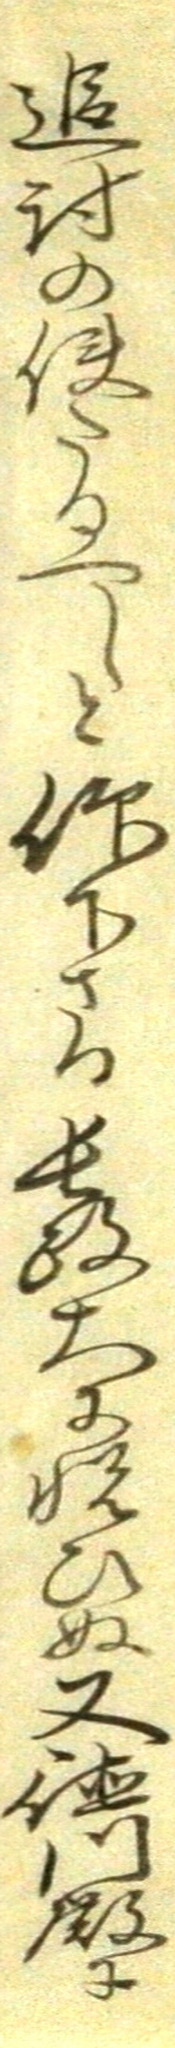追討の使たるへしと仰下さる長政大に悦ひぬ又徳川殿に
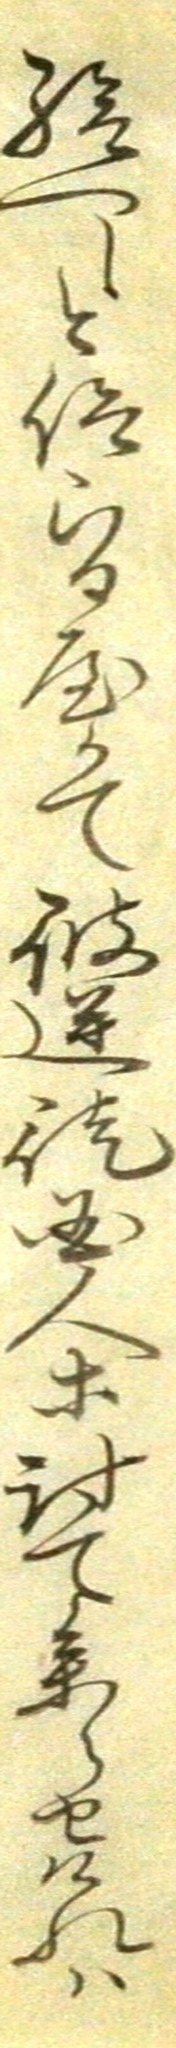給へしと仰らるやかて彼逆徒国人等討て参らせけれは
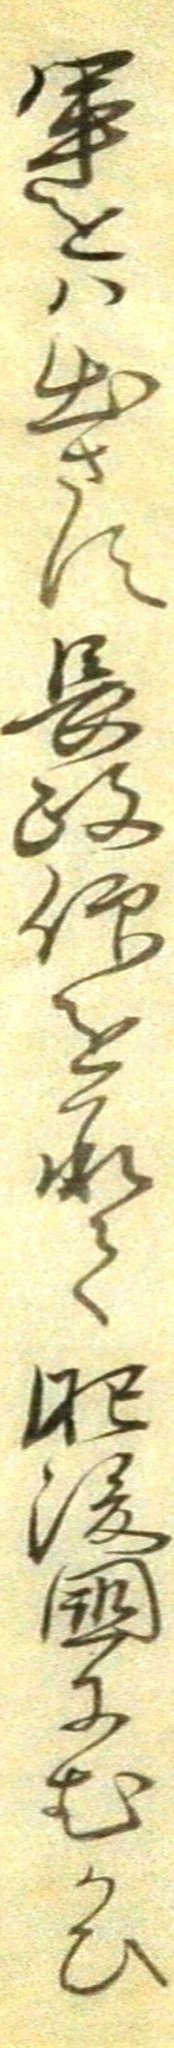軍をは出さす長政仰を承て肥後国にむかひ
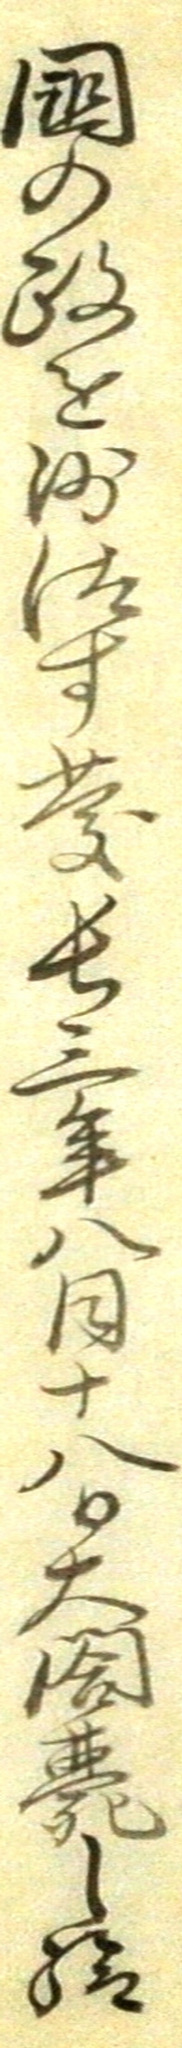国の政を沙汰す慶長三年八月十八日太閤薨し給
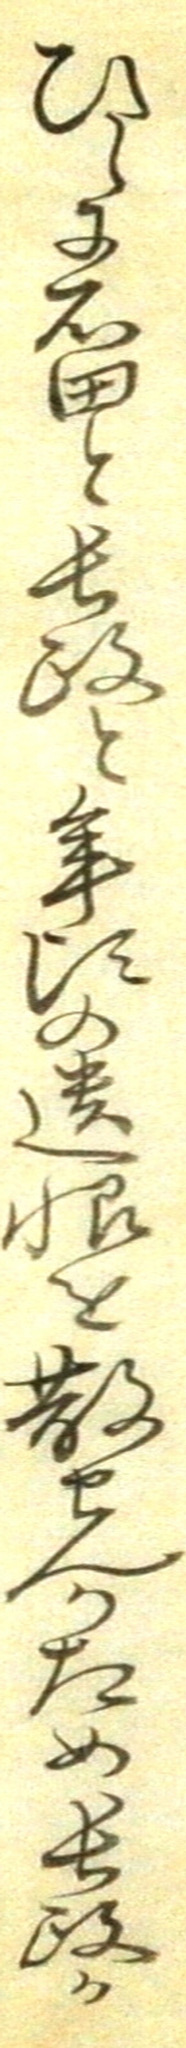ひしに石田と長政と年頃の遺恨を散せんかため長政か
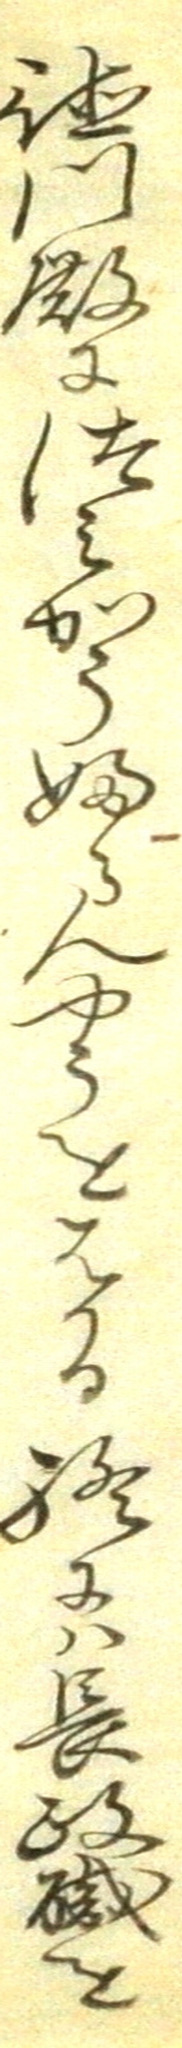徳川殿につみかうふらんやうをはかる終には長政職を
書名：藩翰譜（七・上）
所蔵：伊那市立高遠町図書館・合同会社AMANE
